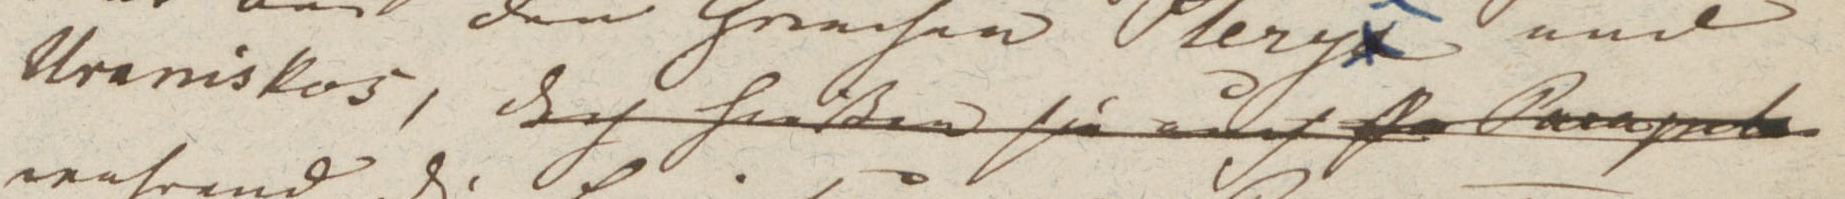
Uraniskos, doch hiessen sie auch Po Parapet
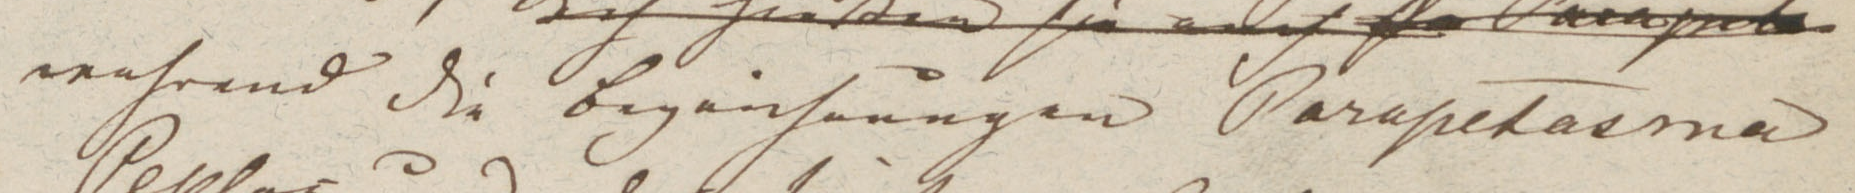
wahrend die Bezeichnungen Parapetasma
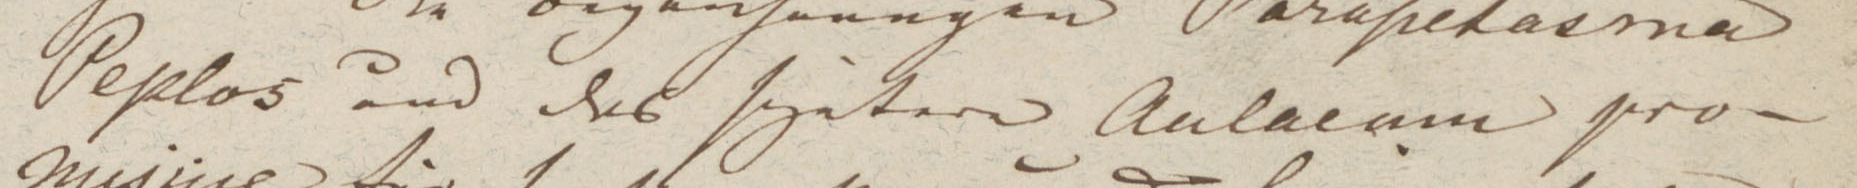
Peplos und das spätere Aulaeum pro-
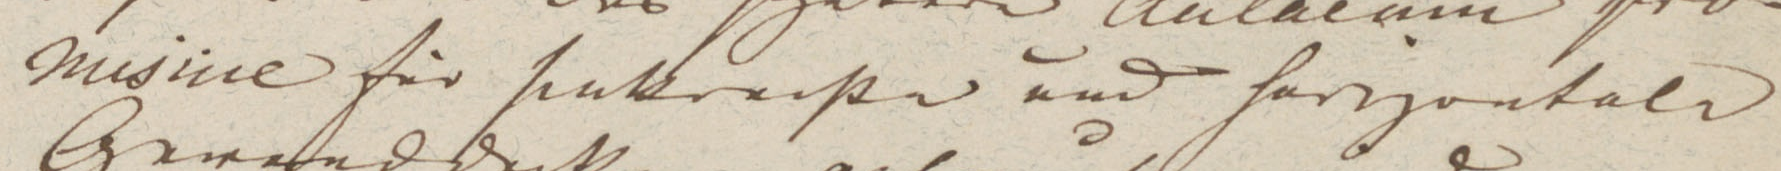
misme für senkrechte und horizontale
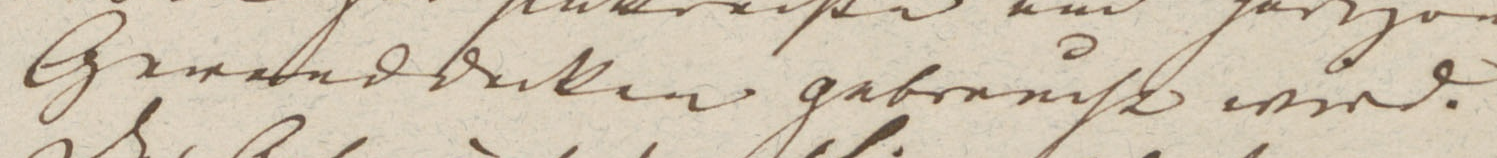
Gewanddecken gebraucht wird.
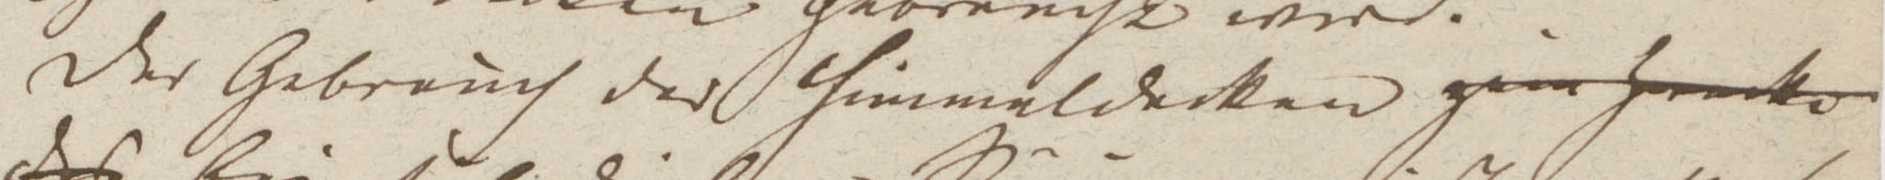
Der Gebrauch der Himmeldecken zum Zwecke
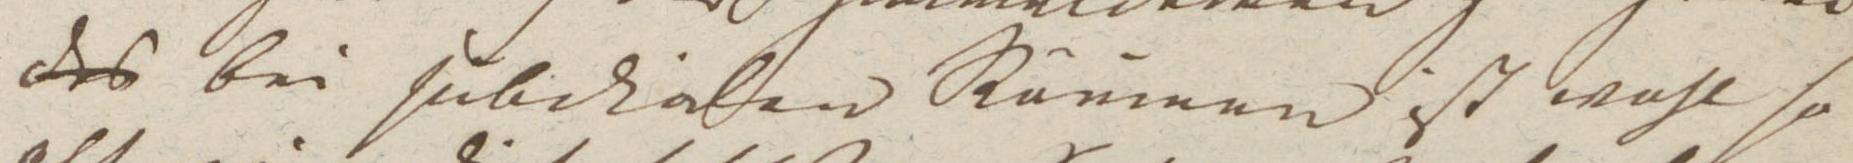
das bei subdialen Räumen ist wohl so
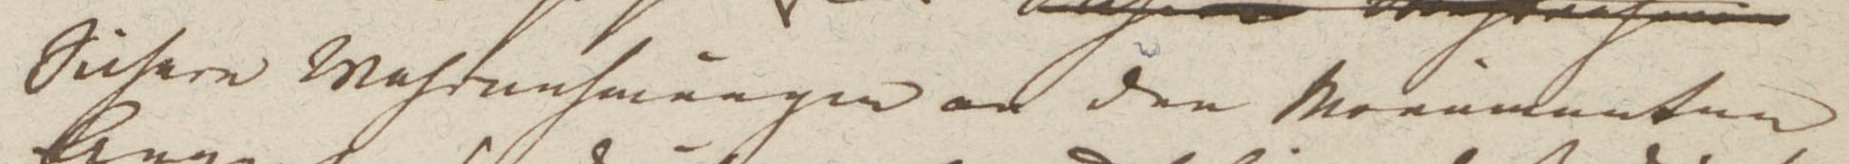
Sichere Wahrnehmungen an den Monumenten
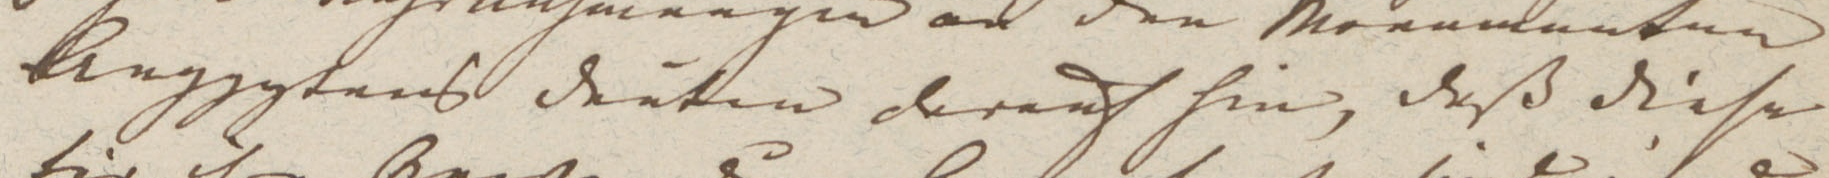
Aegyptens deuten darauf hin, dass diese
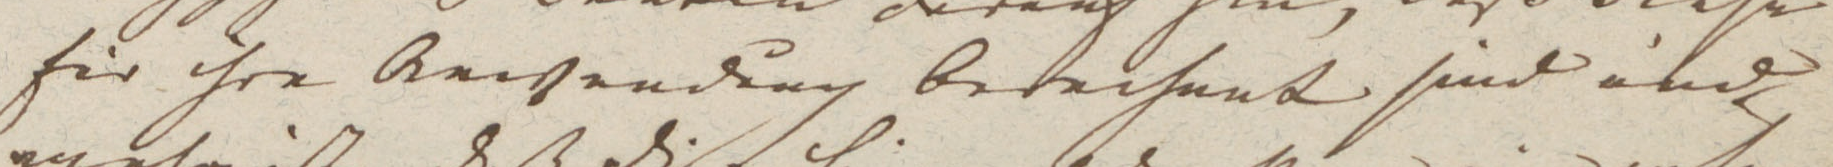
für ihre Anwendung berechnet sind und
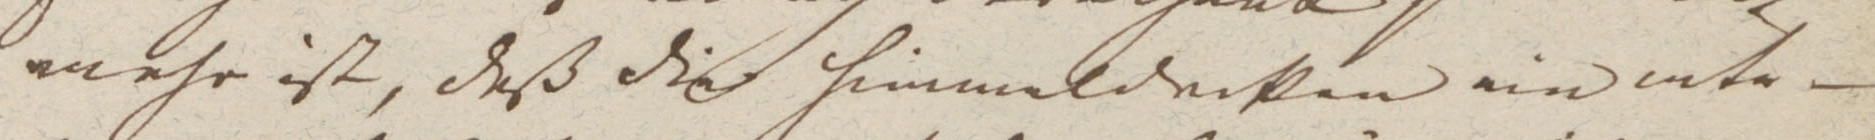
mehr ist, dass die Himmeldecken ein inte-
